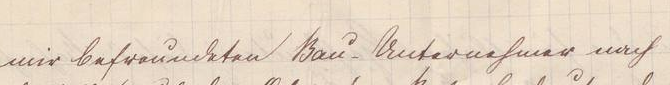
mir befreundeten Bau-Unternehmer nach
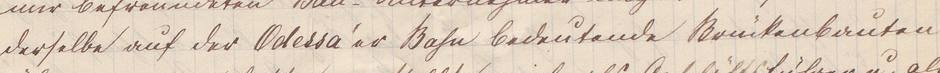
derselbe auf der Odessa'er Bahn bedeutende Brückenbauten
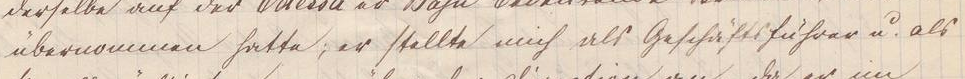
übernommen hatte; er stellte mich als Geschäftsführer u. als
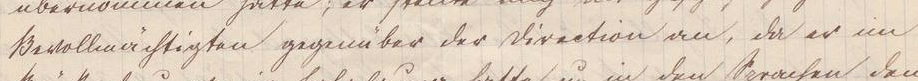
Bevollmächtigten gegenüber der Direction an, da er im
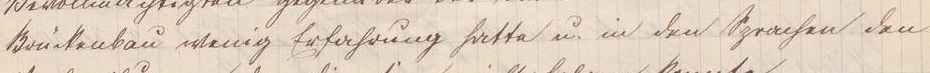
Brückenbau wenig Erfahrung hatte u. in den Sprachen den
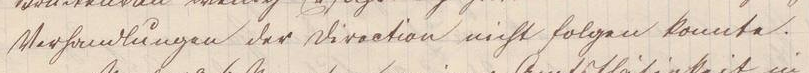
Verhandlungen der Direction nicht folgen konnte.
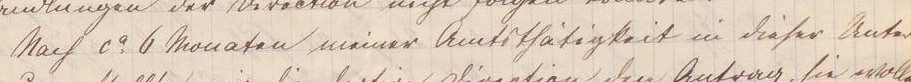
Nach ca 6 Monaten meiner Amtsthätigkeit in dieser Unter-
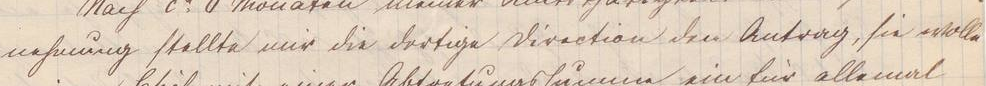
nehmung stellte mir die dortige Direction den Antrag, sie wolle
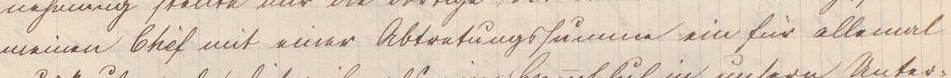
meinen Chèf mit einer Abtretungssumme ein für allemal
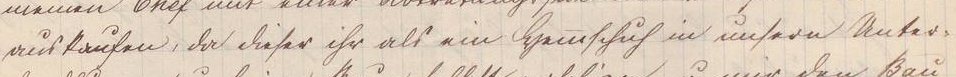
aus kaufen, da dieser ihr als ein Hemmschuh in unsern Unter-
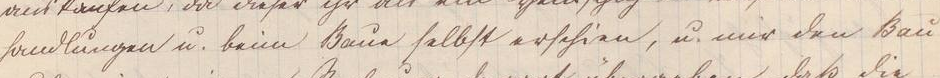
handlungen u. beim Baue selbst erschien, u. mir den Bau
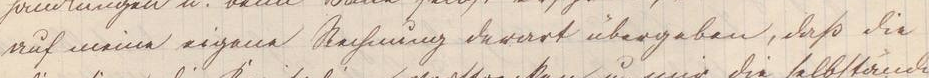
auf meine eigene Rechnung derart übergeben, daß die
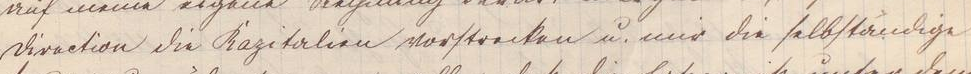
Direction die Kapitalien vorstrecken u. mir die selbständige
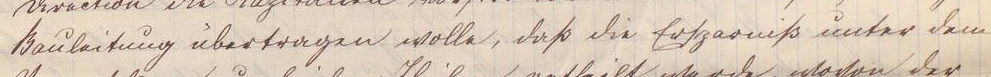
Bauleitung übertragen wolle, daß die Ersparniß unter dem
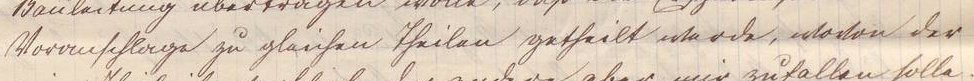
Voranschlage zu gleichen Theilen getheilt werde, wovon der
